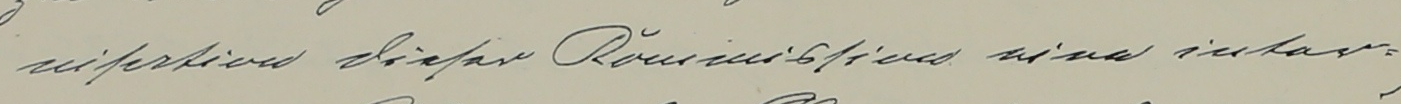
nisation dieser Kommission eine inter-
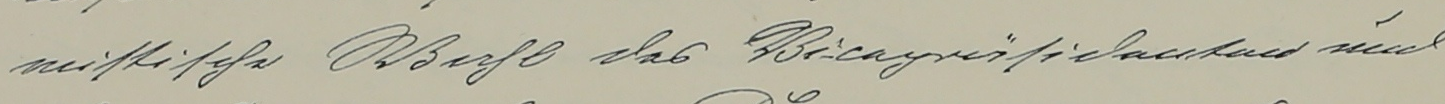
mistische Wahl des Vicepräsidenten und
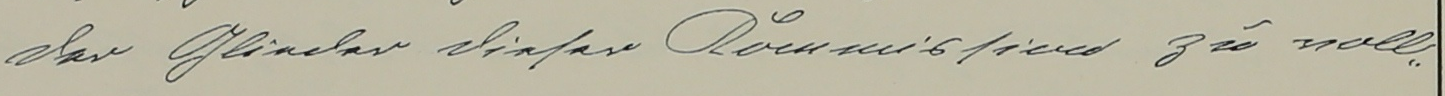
der Glieder dieser Kommission zu voll-
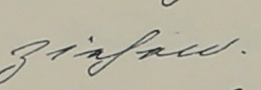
ziehen.
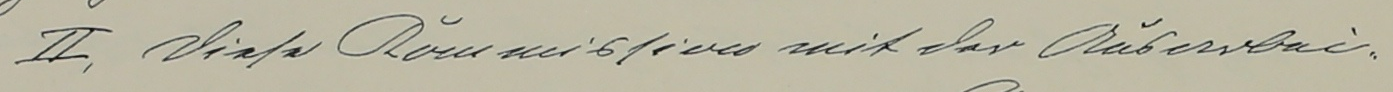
II. Diese Kommission mit der Ausarbei-
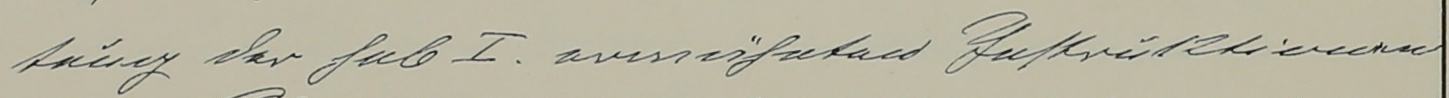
tung der sub I. erwähnten Instruktionen
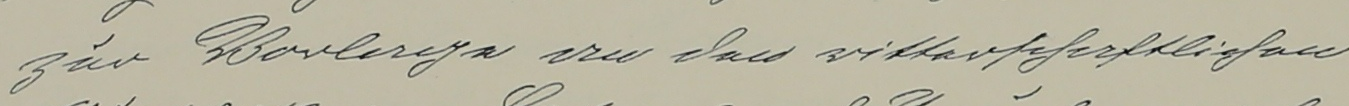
zur Vorlage an den ritterschaftlichen
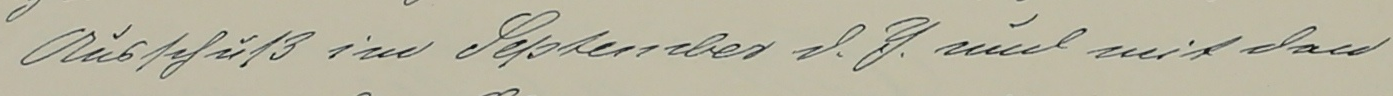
Ausschuß im September d.J. und mit den
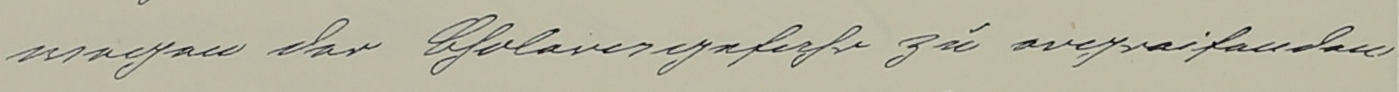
wegen der Choleragefahr zu ergreifenden
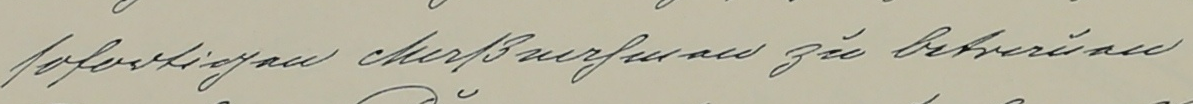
sofortigen Maßnahmen zu betrauen.
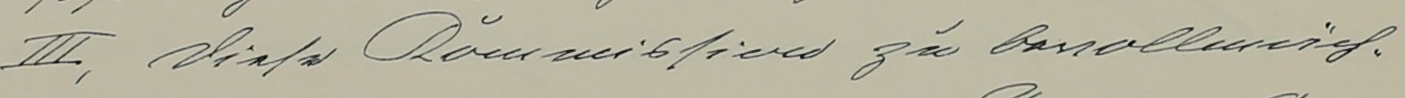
III. Diese Kommission zu bevollmäch-
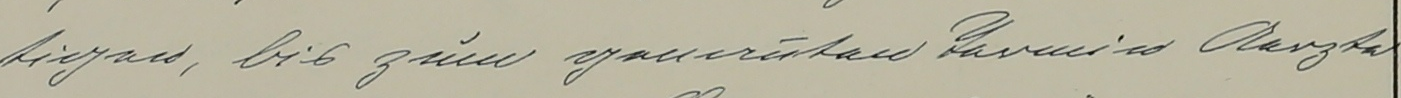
tigen, bis zum genannten Termin Aerzte
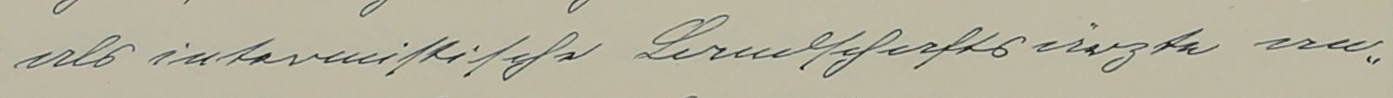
als interimistische Landschaftsärzte an-
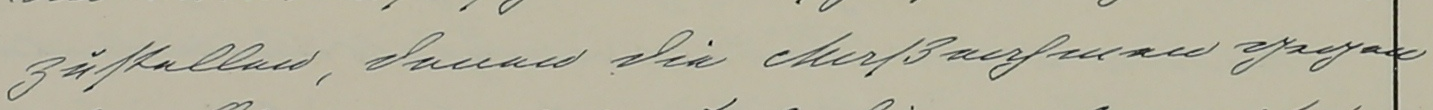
zustellen, denen die Maßnahmen gegen
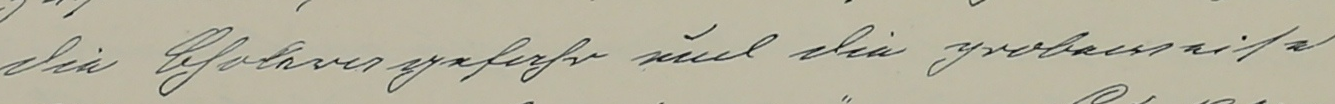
die Choleragefahr und die probeweise
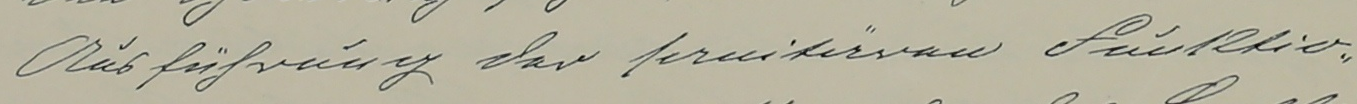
Ausführung der sanitären Funktio-
